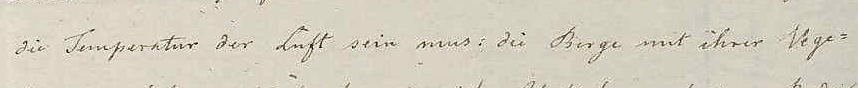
die Temperatur der Luft sein mus: die Berge mit ihrer Vege-
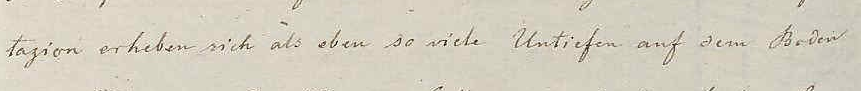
tazion erheben sich als eben so viele Untiefen auf dem Boden
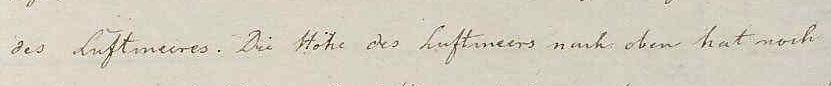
des Luftmeeres. Die Höhe des Luftmeeres nach oben hat noch
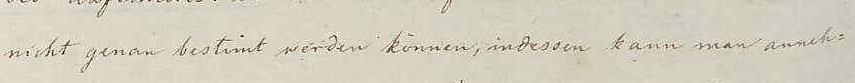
nicht genau bestimt werden können, indessen kann man anneh-
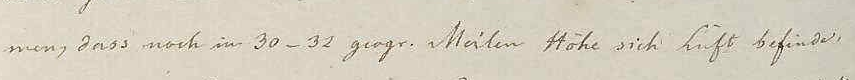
men, dass noch in 30–32 geogr. Meilen Höhe sich Luft befinde,
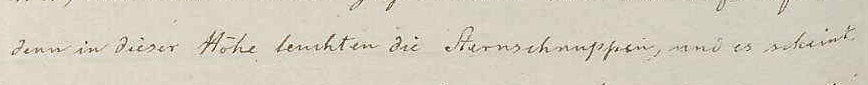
denn in dieser Höhe leuchten die Sternschnuppen, und es scheint
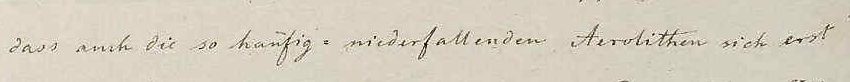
dass auch die so häufig-niederfallenden Aerolithen sich erst
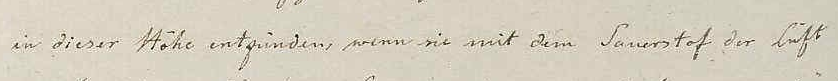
in dieser Höhe entzünden, wenn sie mit dem Sauerstof der Luft
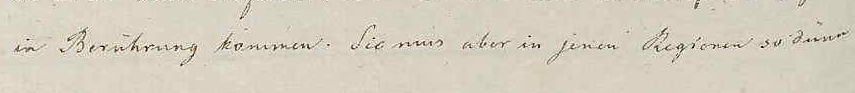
in Berührung kommen. Sie mus aber in jenen Regionen so dünn
